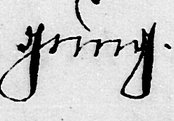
gung.
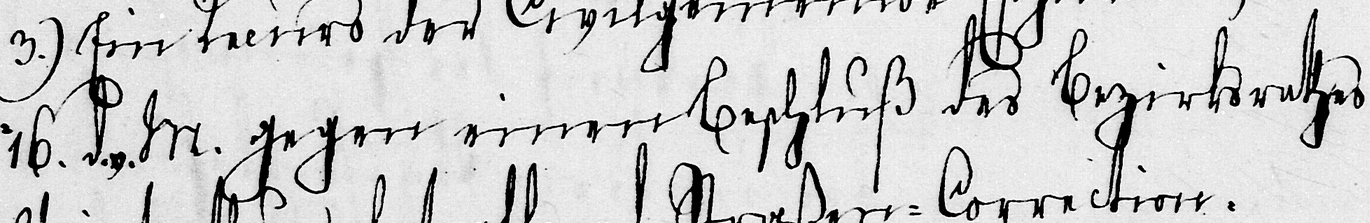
16. d. v. M. gegen einen Beschluß des Bezirksrathes
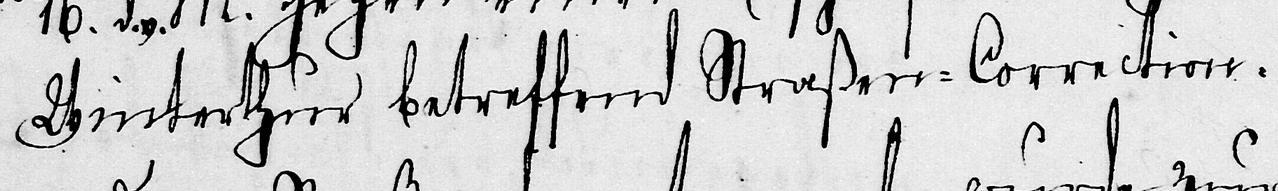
Winterthur betreffend Straßen-Correction.
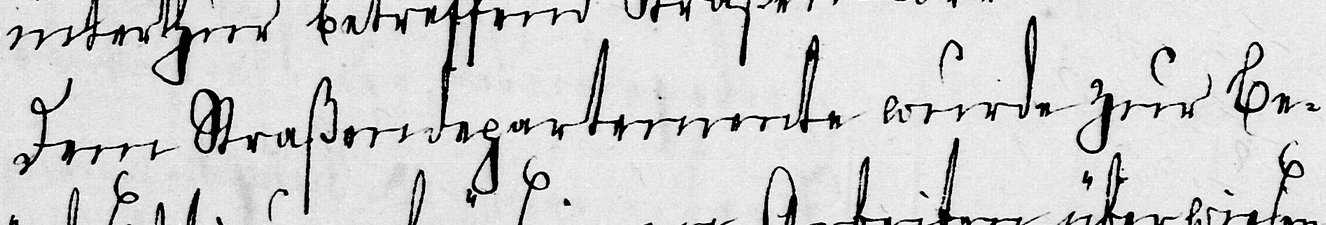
Dem Straßendepartemente wurde zur Ber¬
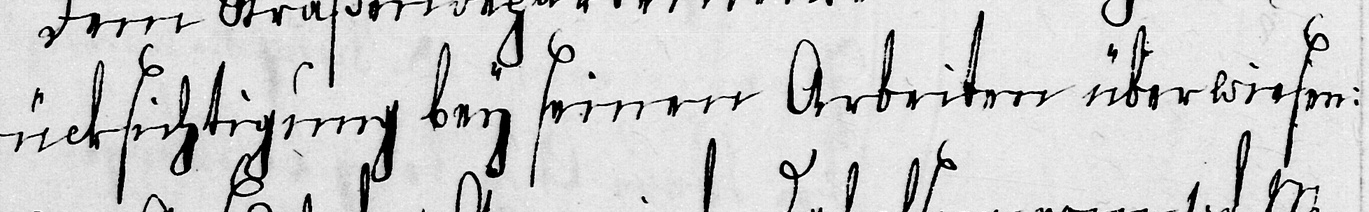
ücksichtigung bey seinen Arbeiten überwiesen:
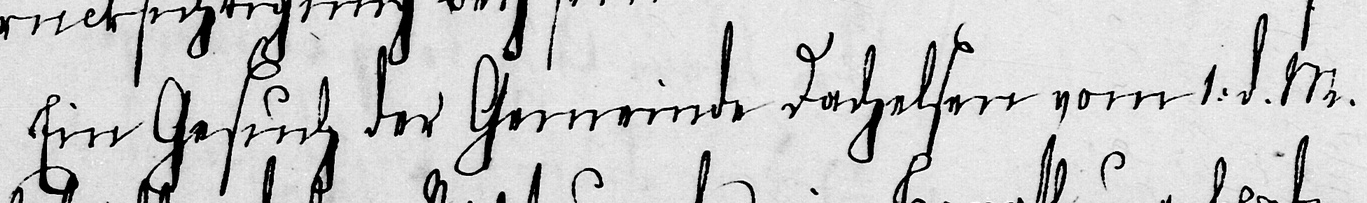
Ein Gesuch der Gemeinde Dachelsen vom 1. d. M.
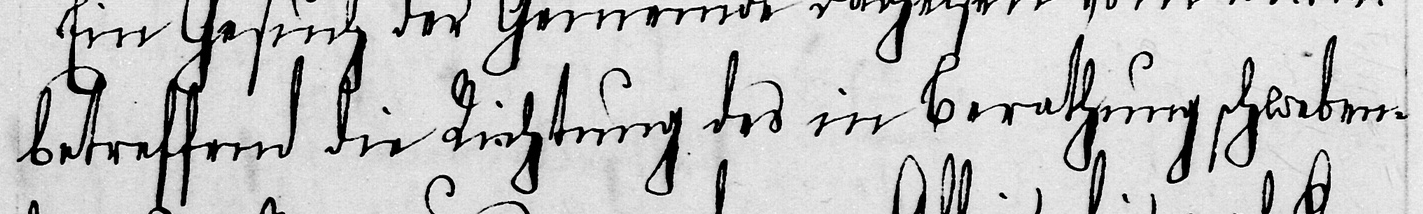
betreffend die Richtung des in Berathung schweben¬
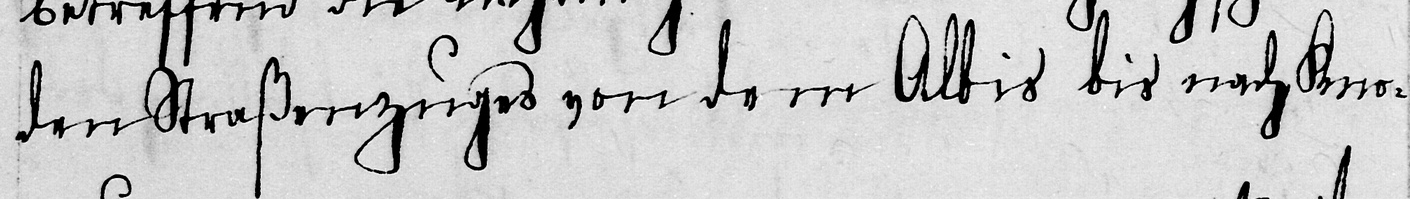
den Straßenzuges von dem Albis bis nach Kno¬
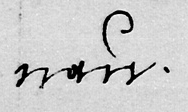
nau.
